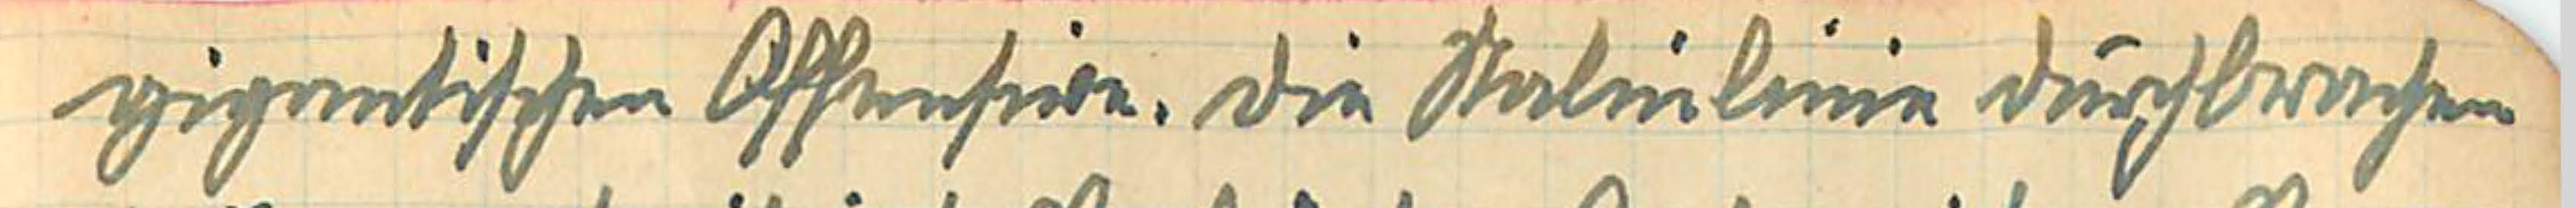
gigantischen Offensive. Die Stalinlinie durchbrachen
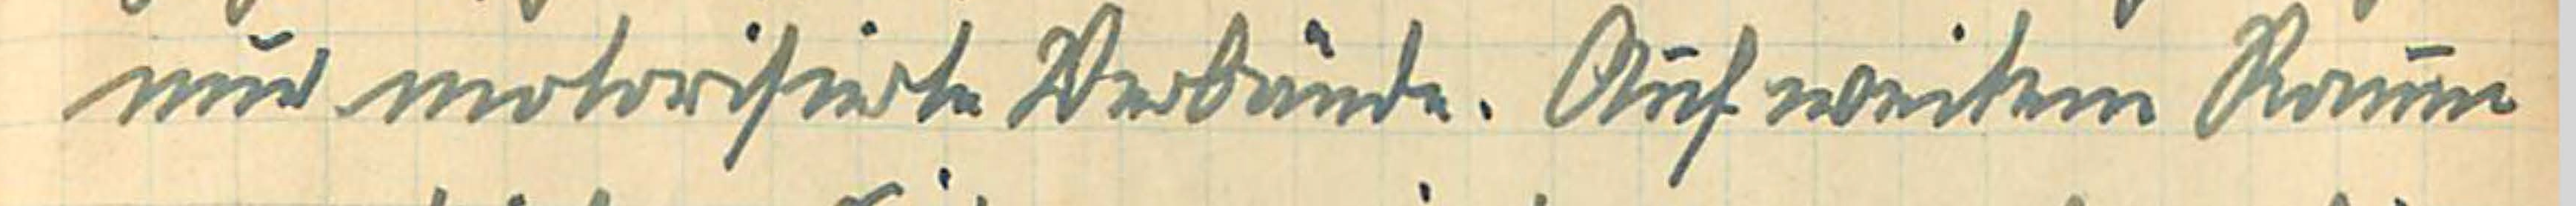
nur motorisierte Verbände. Auf weitem Raum
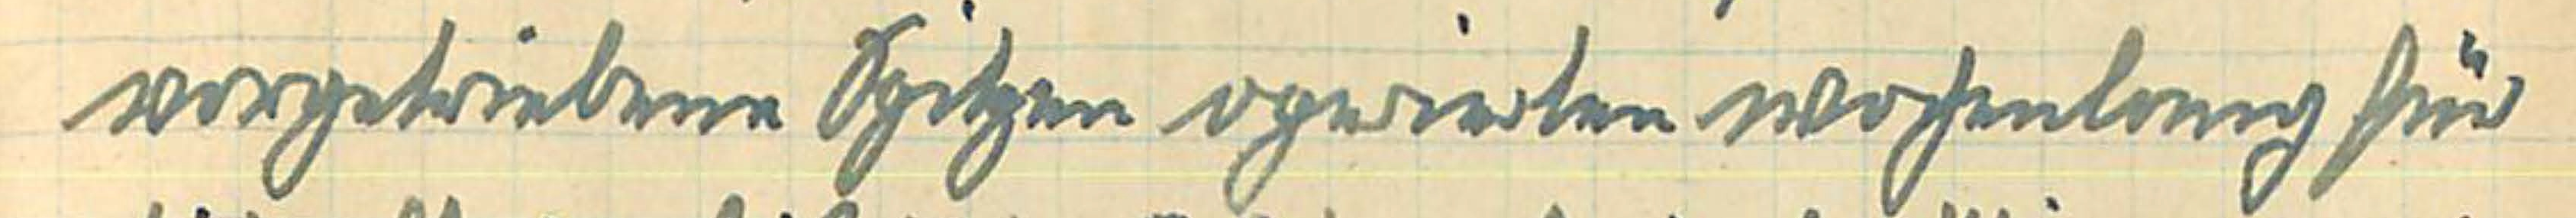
vorgetriebene Spitzen operierten wochenlang für
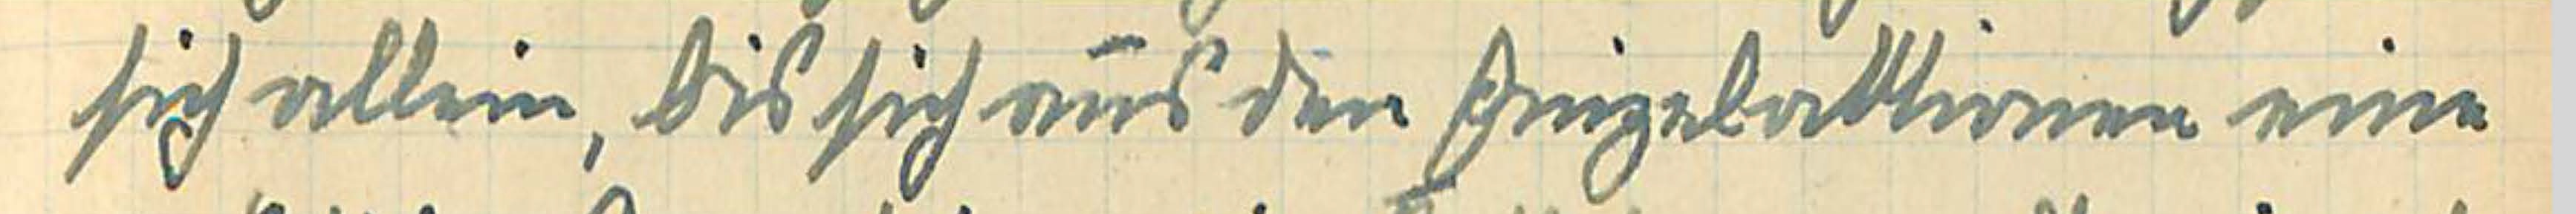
sich allein, bis sich aus den Einzelaktionen eine
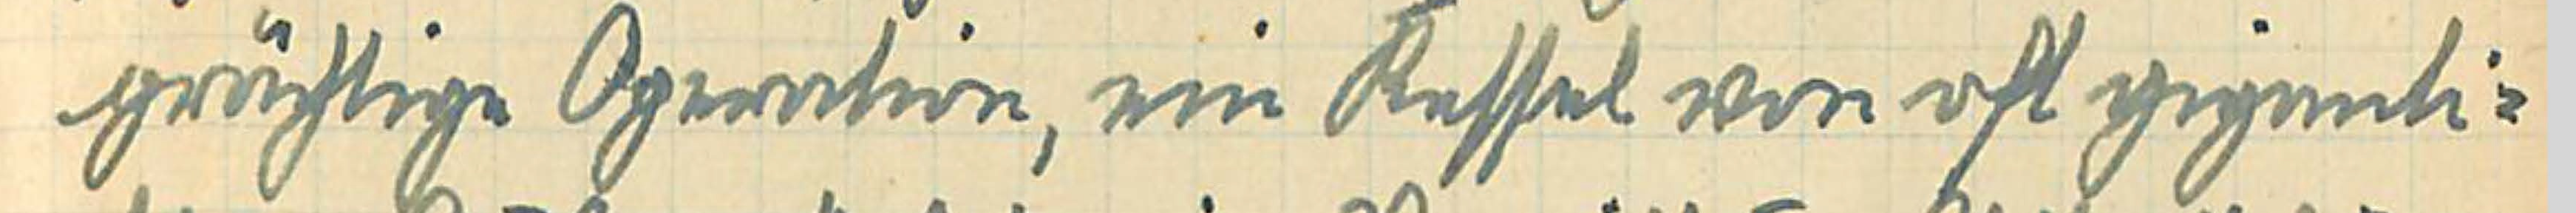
prächtige Operation, ein Kessel von oft giganti-
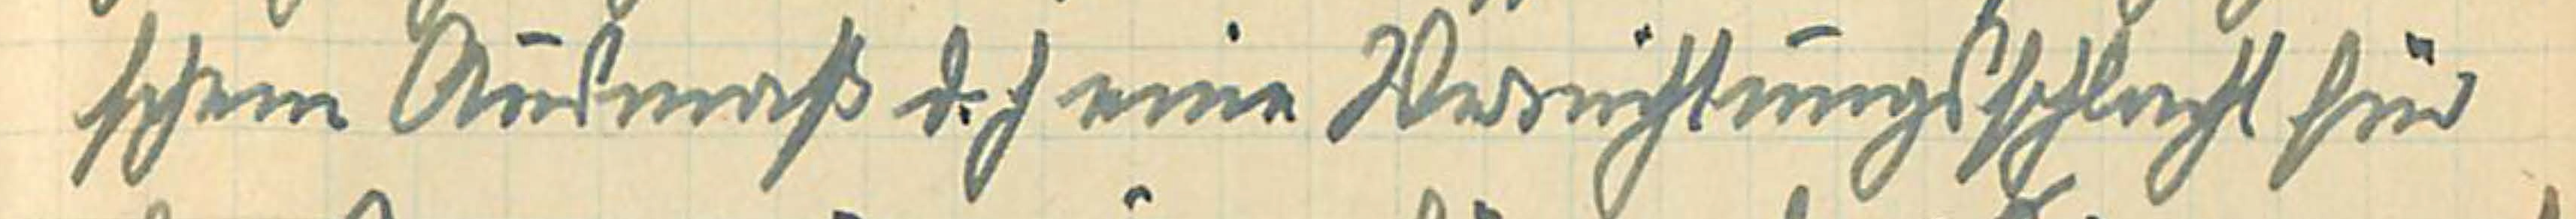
schem Ausmaß d.h. eine Vernichtungsschlacht für
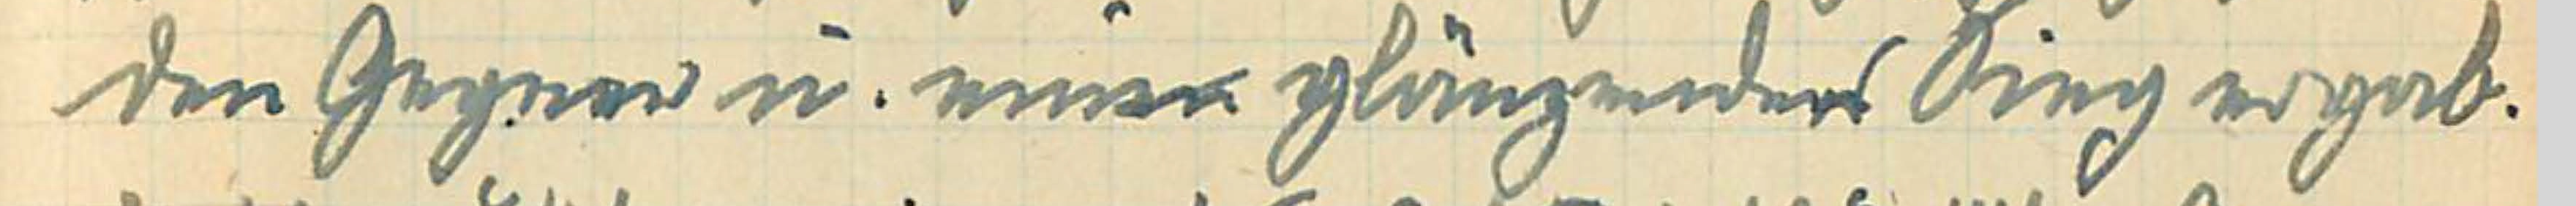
den Gegner u. einen glänzenden Sieg ergab.
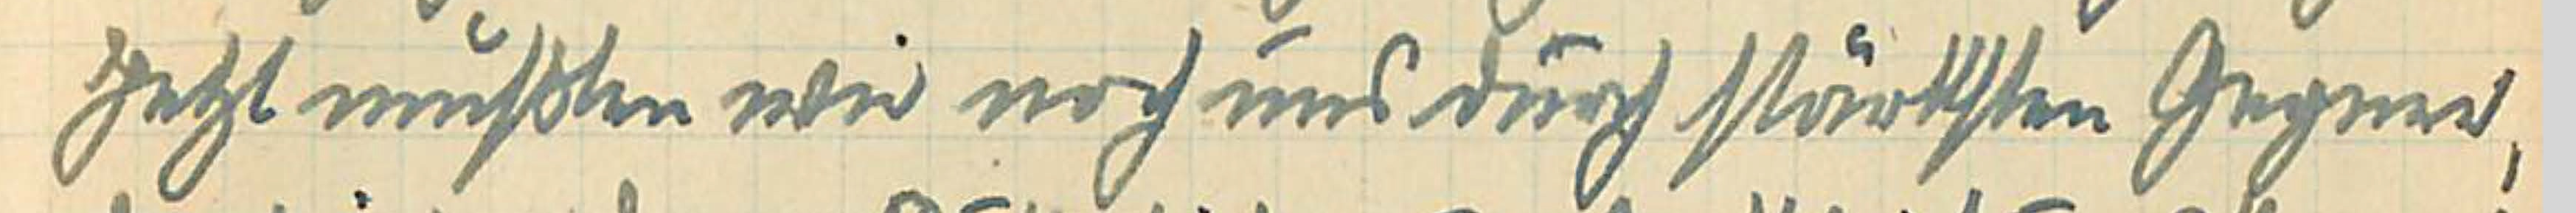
Jetzt mußten wir noch uns durch stärksten Gegner,
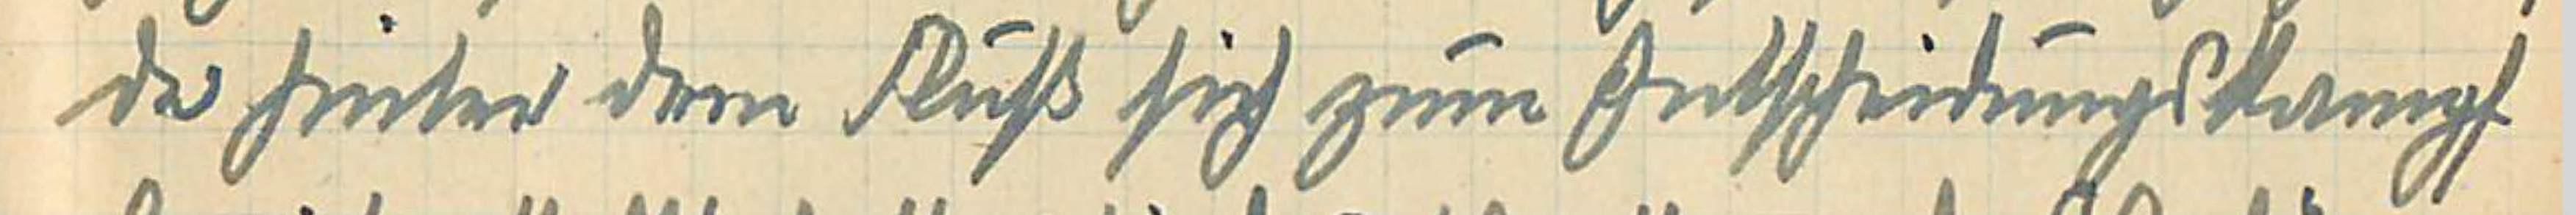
der hinter dem Fluß sich zum Entscheidungskampf
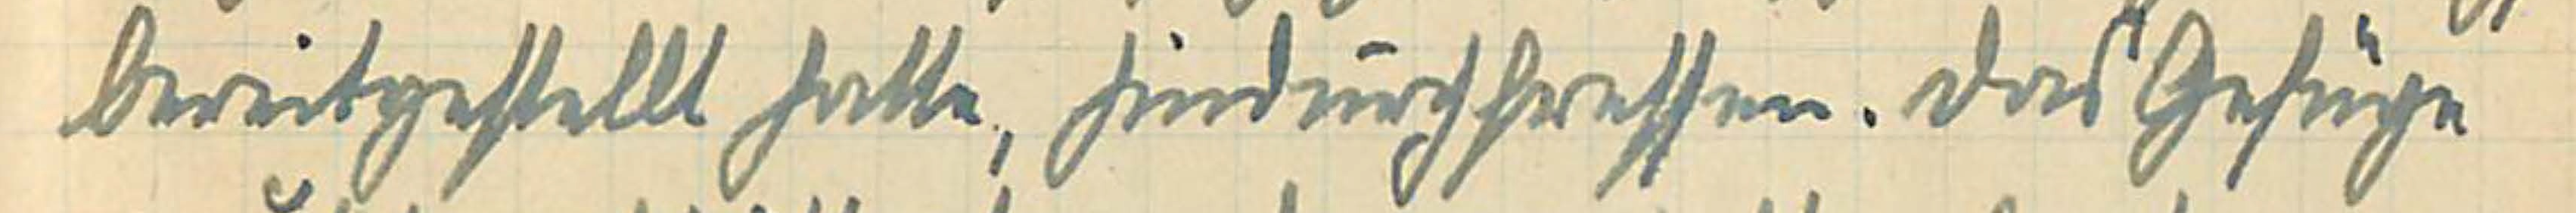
bereitgestellt hatte, hindurchfressen. Das Gefüge
